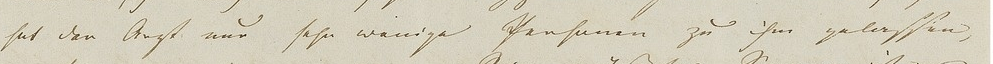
hat der Arzt nur sehr wenige Personen zu ihm gelassen,
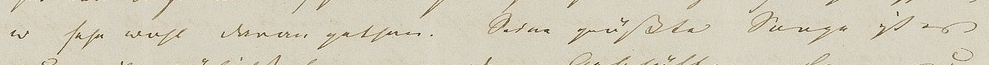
& sehr wohl daran gethan. Seine größte Sorge ist es
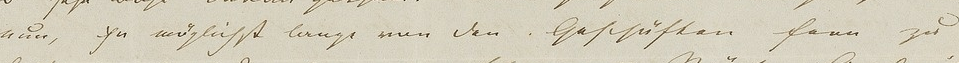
nun, ihn möglichst lange von den Geschäften fern zu
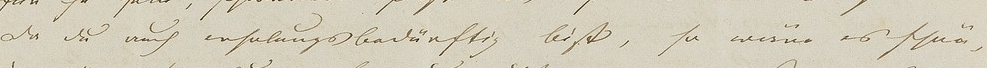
Da du auch erholungsbedürftig bist, so wäre es schön,
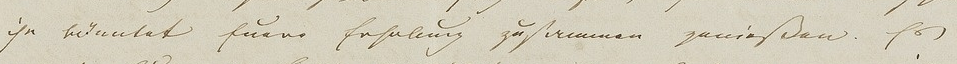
ihr könntet Euere Erholung zusammen genießen. Es
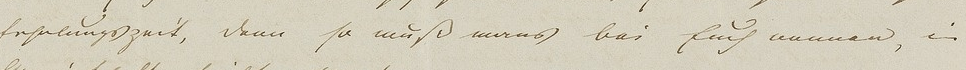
Erholungszeit, denn so muß mans bei Euch nennen, in
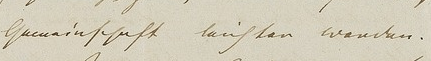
Gemeinschaft leichter werden.
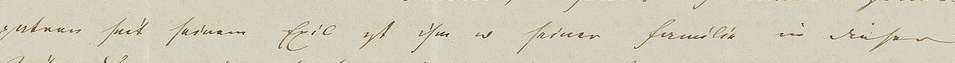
patron seit seinem Exil ist ihm & seiner Familie in dieser
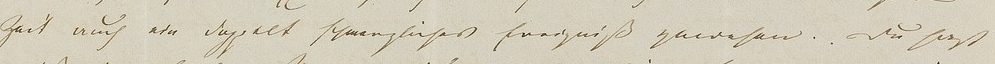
Zeit auch ein doppelt schmerzliches Ereigniß gewesen. Du hast
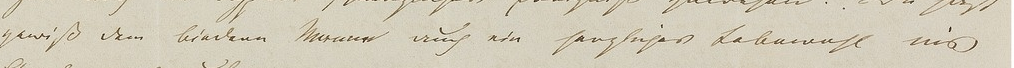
gewiß dem biedern Manne auch ein herzliches Lebewohl ins
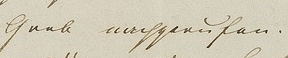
Grab nachgerufen.
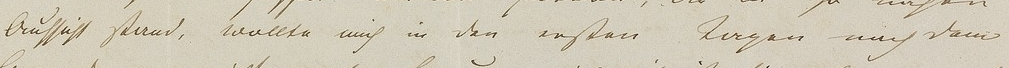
Aussicht stand, wollte mich in den ersten Tagen nach dem
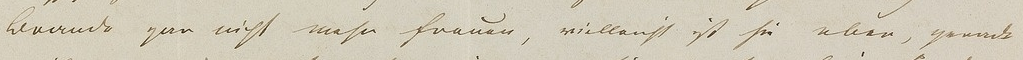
Brande gar nicht mehr freuen, vielleicht ist sie aber, gerade
